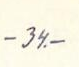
34
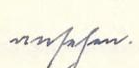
ansehe.
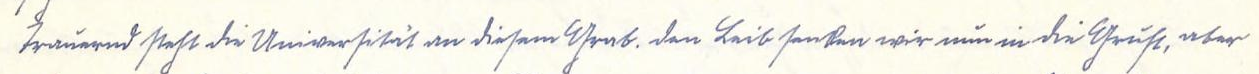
Trauernd steht die Universität an diesem Grab. Den Leib senken wir nun in die Gruft, aber
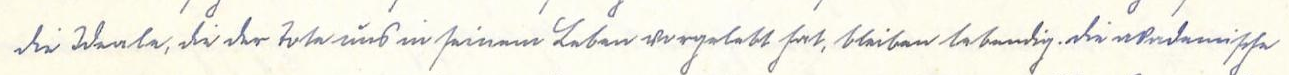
die Ideale, die der Tote uns in seinem Leben vorgelebt hat, bleiben lebendig. Die akademische
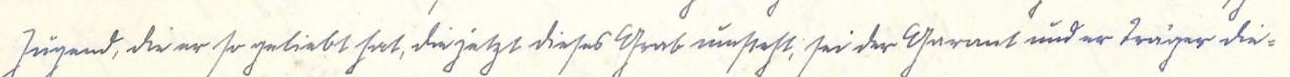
Jugend, die er so geliebt hat, die jetzt dieses Grab umsteht, sei der Garant und er Träger die-
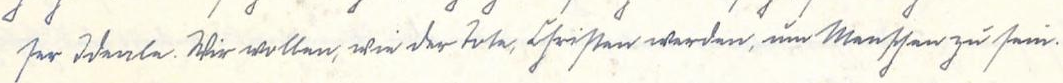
ser Ideale. Wir wollen, wie der Tote, Christen werden, um Menschen zu sein.
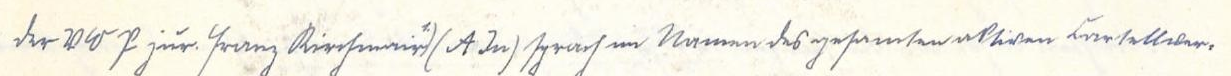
Der VOP iur. Franz Kirchmair *) sprach im Namen der Gesamt gesamten aktiven Cartellver-
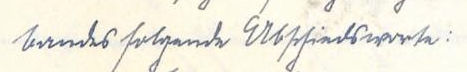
bandes folgende Abschiedsworte
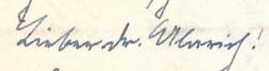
Lieber Dr. Alarich!
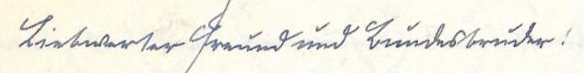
Liebenswerter Freund um Bundesbruder!
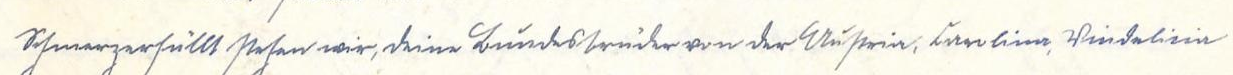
Schmerzerfüllt stehen wir, deine Bundesbrüder von der Austria, Carolina, Vindelicia
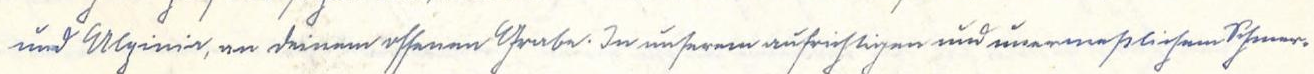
und Alpinia an diesem offenen Grab. In unserem aufrichtigen und unermeßlichen Schmer-
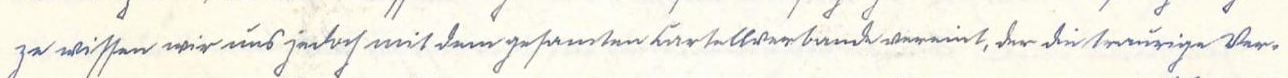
ze wissen wir uns jedoch mit dem gesamten Cartellverband vereint, der die traurige Ver-
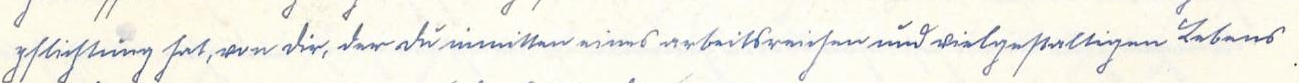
pflichtung hat, von dir, der du, inmitten eines arbeitsreichen und vielgestaltigen Lebens
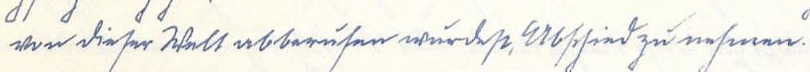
von dieser Welt abberufen wurdest, Abschied zu nehmen.
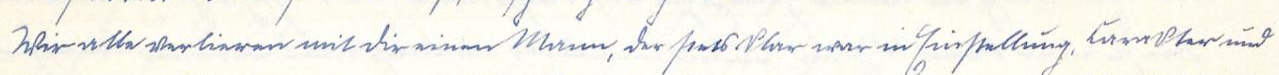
Wir alle verlieren mit dir einen Mann, der stets klar war in Einstellung, Carakter und
